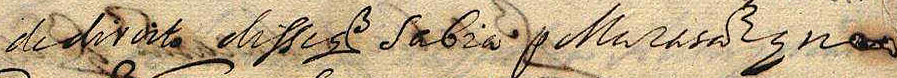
de direito disse q̄ sabia pella razaõ que
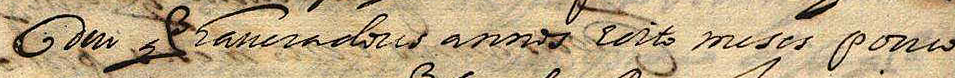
deu q̄ hauera dous annos E oito meses pouco
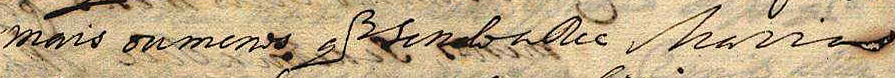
mais ou menos q̄ sendo a Ree Maria
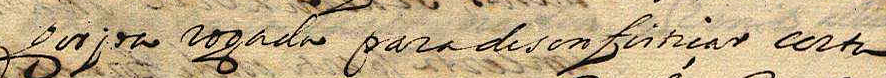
gorjoa rogada para desenfeitiçar certa
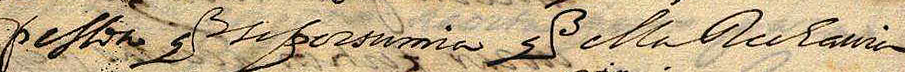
pessoa q̄ se persumia q̄ ella Ree hauia
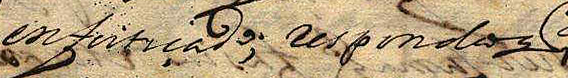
enfeitiçado, respondeo q̄
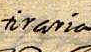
tiraria
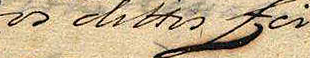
os dittos fei
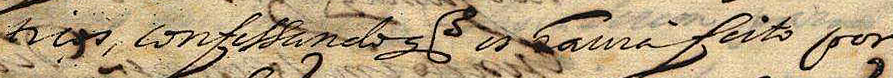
tiços, confessando q̄ os hauia feito por
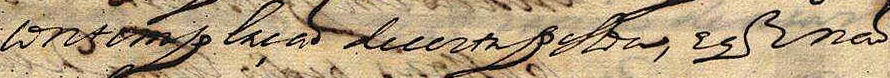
contemplaçaõ de certa pessoa, E q̄ não
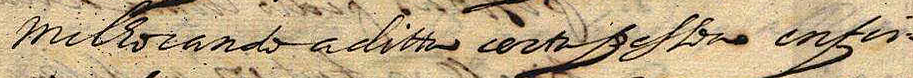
melhorando a ditta certa pessoa enfei
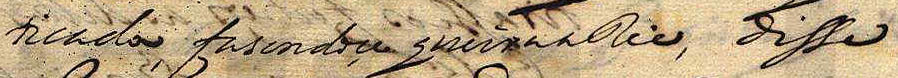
tiçada, fasendoce queixa a Ree, disse
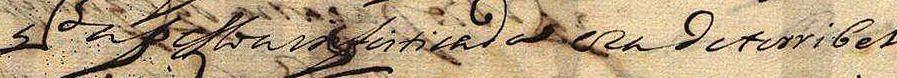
q̄ a pessoa infeitiçada era de terribel
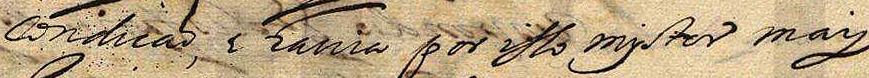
condiçaõ, E hauia por isso myster mais
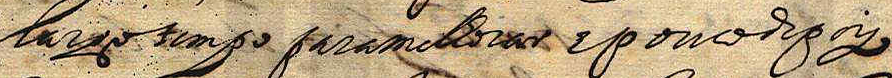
largo tempo para melhorar E pouco depois
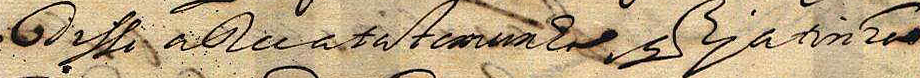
disse a Ree a testemunha, q̄ ja tinha
